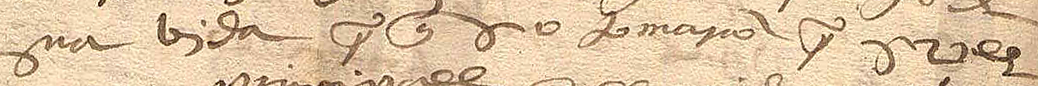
sua vida p̄oq̄ so tomaraõ p̄o ser elle
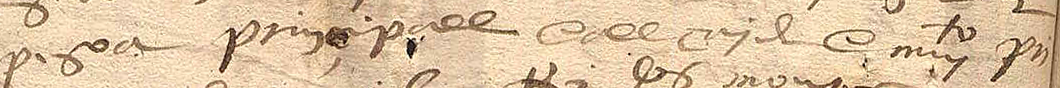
pesoa principall e allcajde e mujto pri
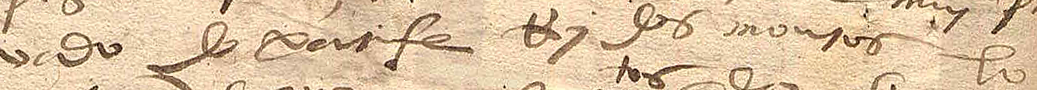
vado do xarife Rej dos mouros ho
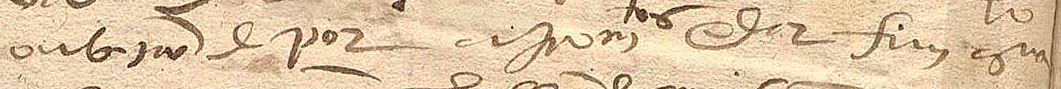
ouverão de por a tromtos e dar fim a sua
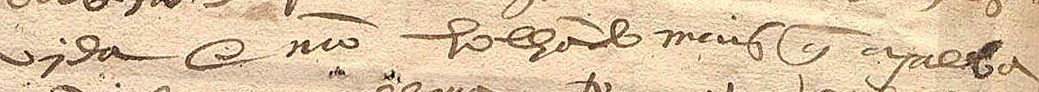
vida e não holhādo mais q̄ a sallva
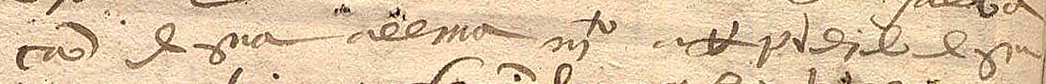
ção de sua allma mto aRepēdido de seu
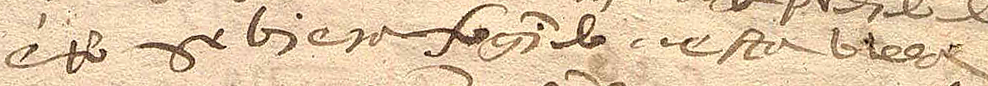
eRo se viera fogīdo a esta villa
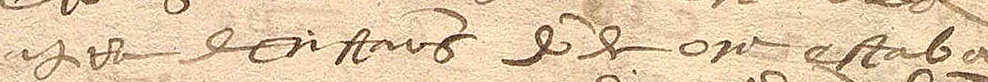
a teRa de cristãos dōde ora estava
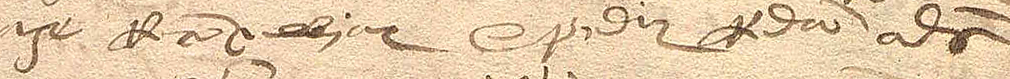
a se Recōcelljar e pedir ꝑdaõ a ds̄
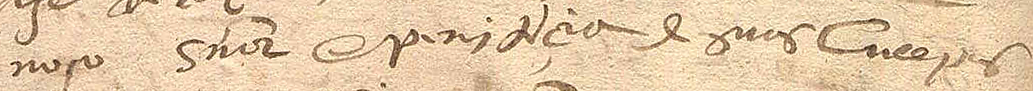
noso Snōr e penitēcia de suas Cullpas
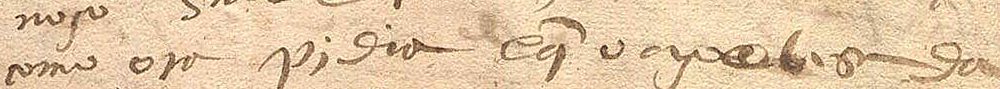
como ora pjdia e q̄ o asollvese da
